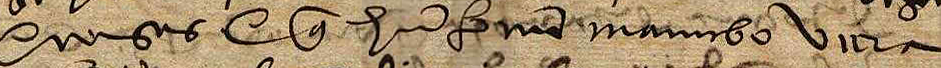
e cousas e q̄ hū homē mancebo viera
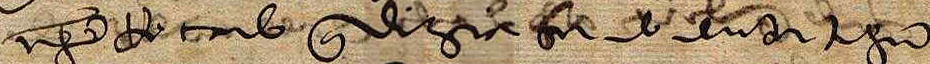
cō hū Recado q̄ dizia ser do doutor Johā
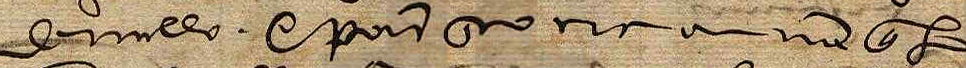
de mello. e porē se o era o nā q̄ ho
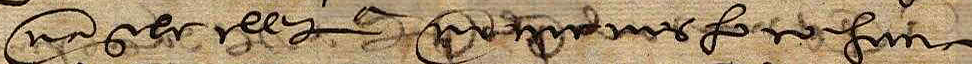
nā sabe elle ta nē menos ho conhecia
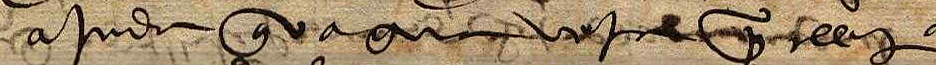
aJnda q̄ o agora vira p̄o elle ta
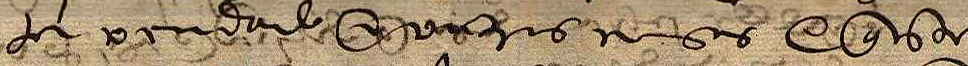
ter o cuidado ē outras cousas e q̄ este
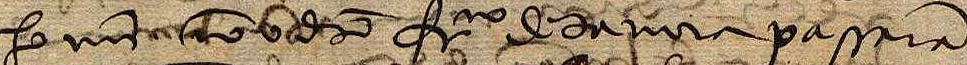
homē c̄o o dito frco de tauora passarā
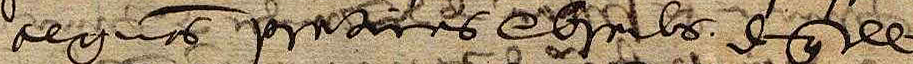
alguās praticas e brados de q̄ elle
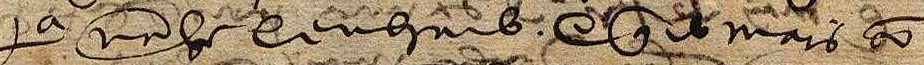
ta nā he lenbrado. e q̄ do mais c̄o
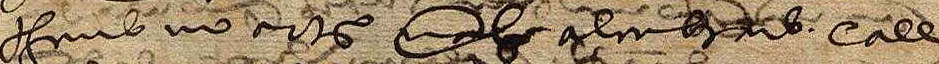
theudo no arto nā he alembrado. e all
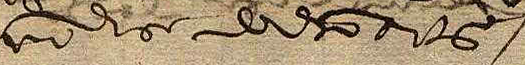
nō dise do dto arto /
